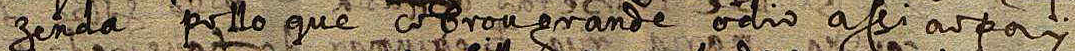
zenda pollo que cobrou grande odio assi ao pay.
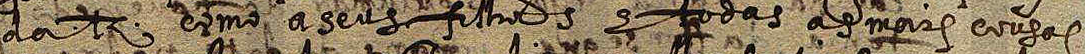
da .R. como a seus filhos E todas as mais cousas
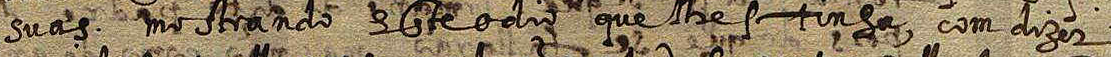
suas mostrando Este odio que lhes tinha, com dizer
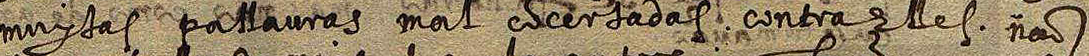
muytas pallauras mal cōcertadas contra Elles. naõ
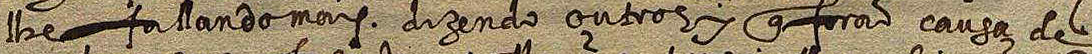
lhe fallando mais. dizendo outrosy q̄ foraõ causa de
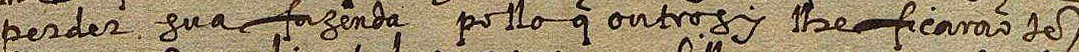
perder sua fazenda pollo q̄ outrosy lhe ficaraõ tē
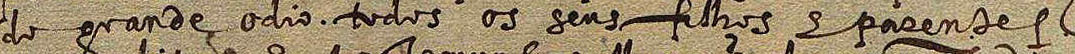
do grande odio. todos os seus filhos E parentes
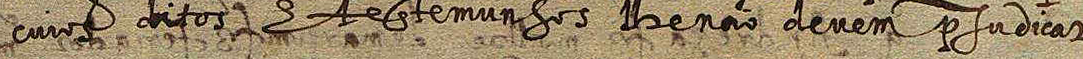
cuios ditos E testemunhos lhe não deuem p̄judicar
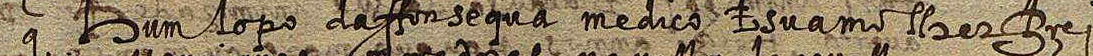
q̄ hum lopo da ffonsequa medico E sua molher Brej
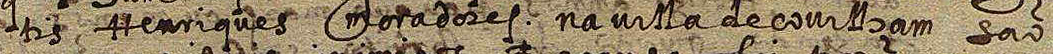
tis Henriques moradores. na uilla de couilham saõ
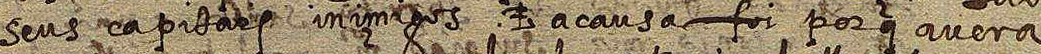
seus capitais inimigos. E a causa foi por q̄ auera
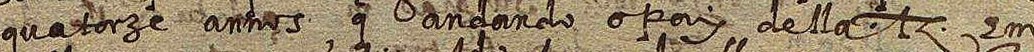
quatorze annos q̄ andando o pay della .R. Em
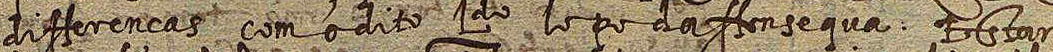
differenças com o dito Ldo lopo da ffonsequa. Estan
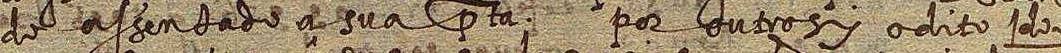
do assentado a sua p̄ta. por outrosy o dito Ldo
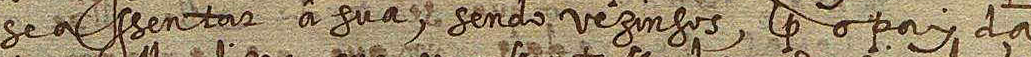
se assentar â sua, sendo vezinhos, p̄ o pay da
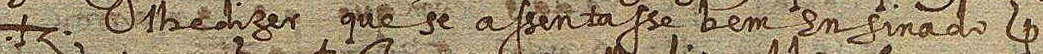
.R. lhe dizer que se assentasse bem Ensinado p̄
